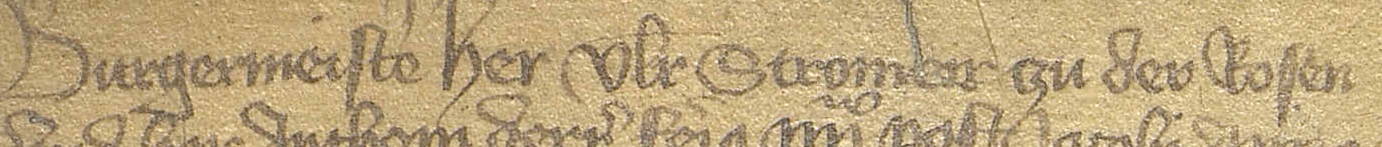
Burgermeiſte* her Vlr Stromeir cʒu der Roſen
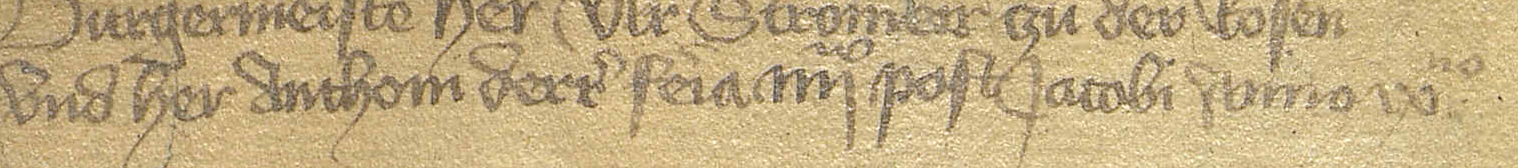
vnd her Anthoni derr* feia* iiii* poſt Iacobi Anno ix*
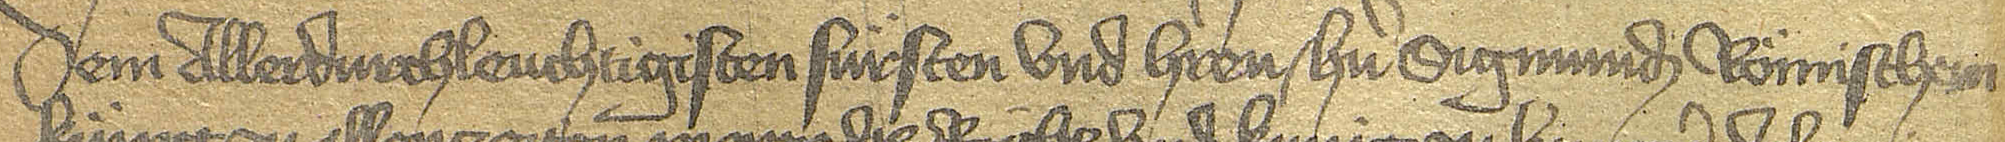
Dem Allerdurchleuchtigiſten fürſten vnd hr*en / hn* Sigmund* Römiſchen
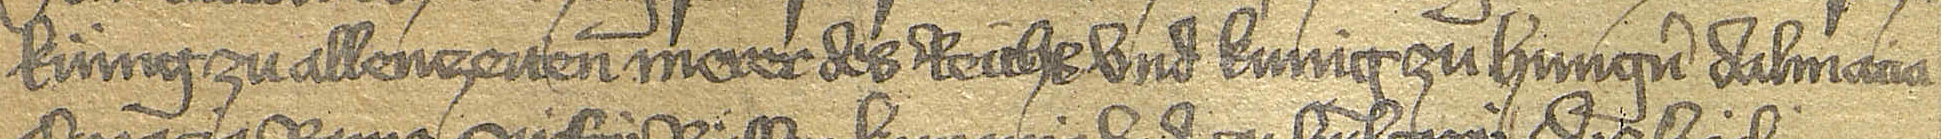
künig cʒu allencʒeiten merer des Reichs vnd kunig cʒu hungn* dalmacia
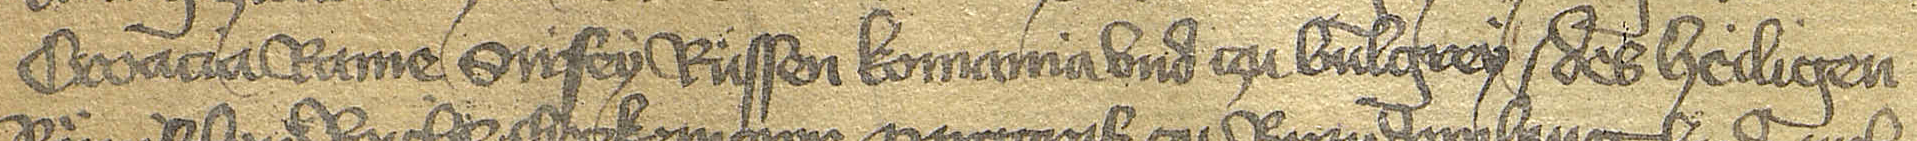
Croacia Rame Sirfey Rüſſen komania vnd cʒu bulgrey / des heiligen
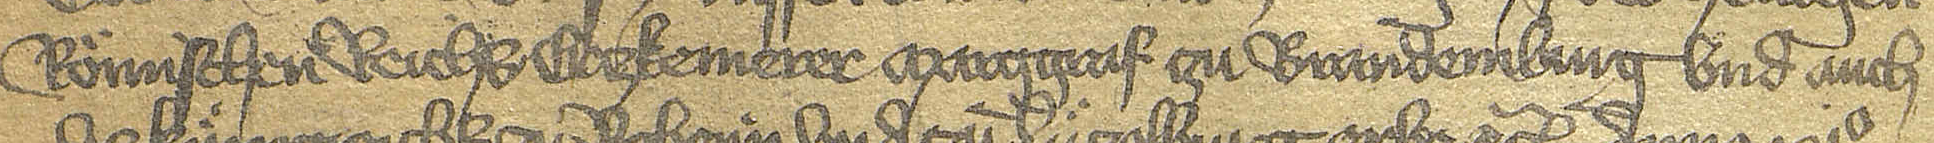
Römiſchen Reichs Ercʒkemerer Marggraf cʒu Brandemburg vnd auch
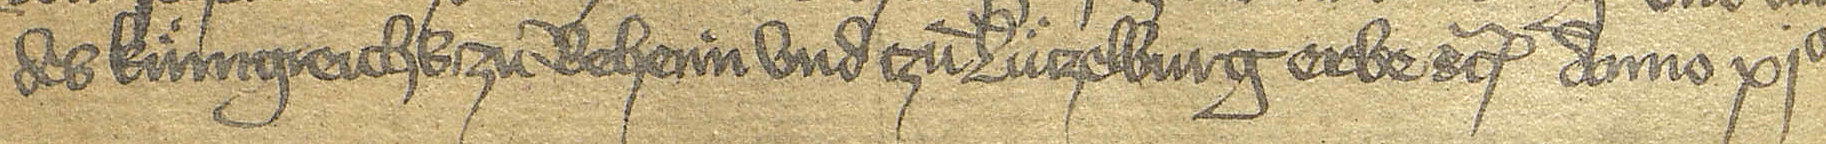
des künigreichs cʒu Beheim vnd cʒu Lücʒelburg erbe ec* Anno xi*
